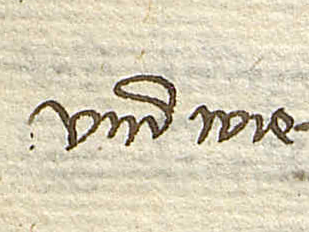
vnd wie
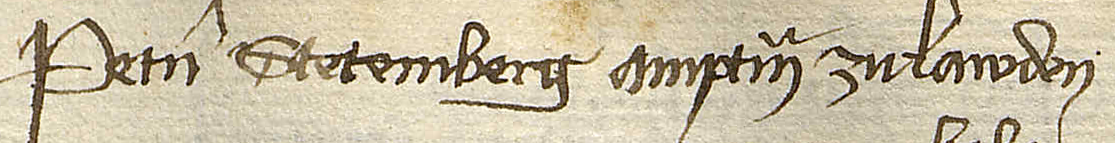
Petn* Stetemberg amptm* ʒu Lawden
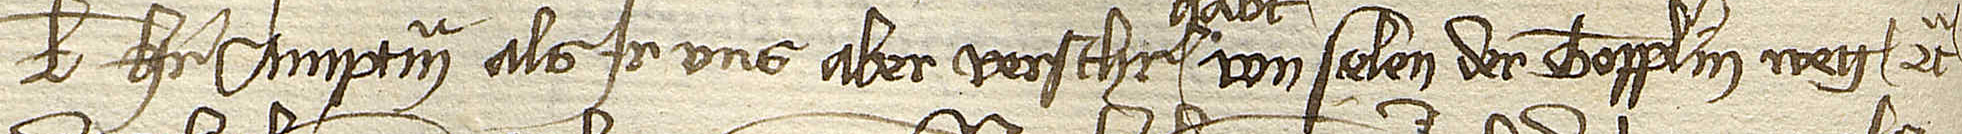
L* hr* Amptm* als Ir vns aber verſchr* von ſelen der Toppl*in weg* ec*
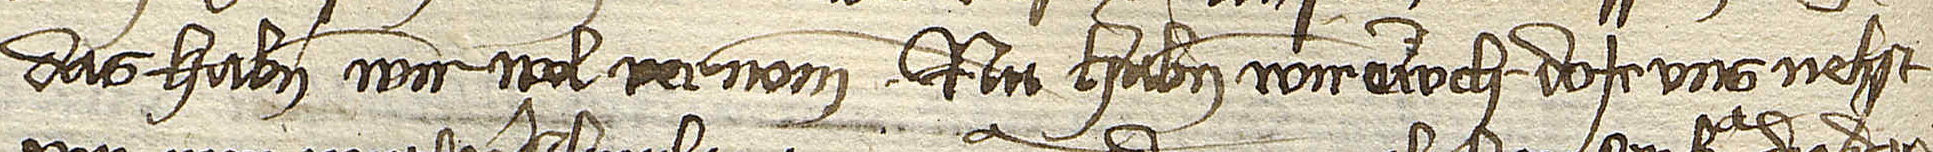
Das habn* wir wol vernom* . Nu habn* wir eẅch - do Ir vns nehſt
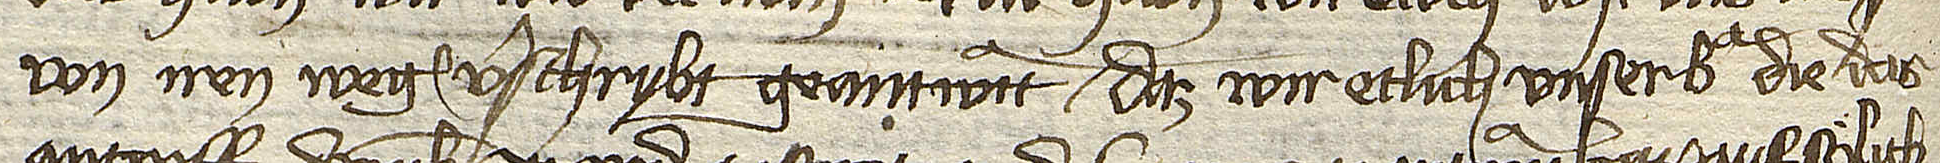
von iren weg* v*ſchrybt geantw*tt / Daʒ wir etlich vnſer b* die das
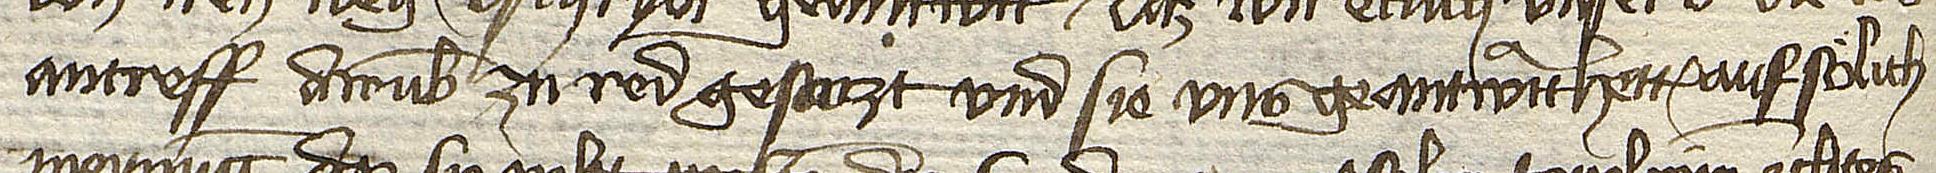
antreff darub* ʒu red geſacʒt vnd ſie vns geantw*tt hett* auf ſölich
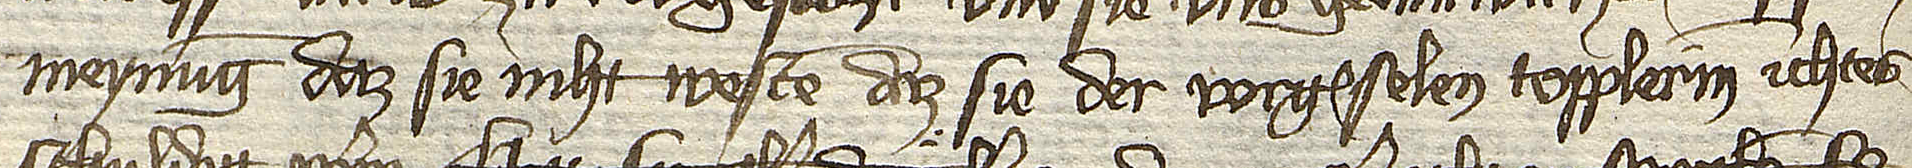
meynu*g daʒ ſie niht weſte* daʒ ſie der vorg* ſelen topllerin* ichtes
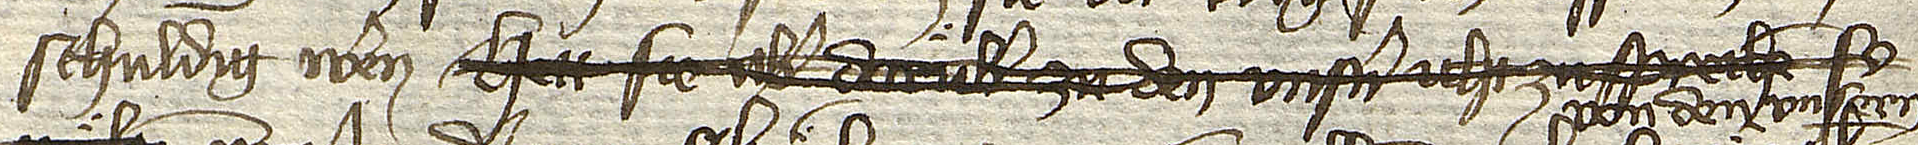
ſchuldig w*en / Hett ſie ab* darüb* ʒu den vnſn* icht ʒuſpreche* ſo
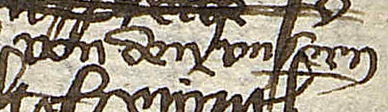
von den vnſern
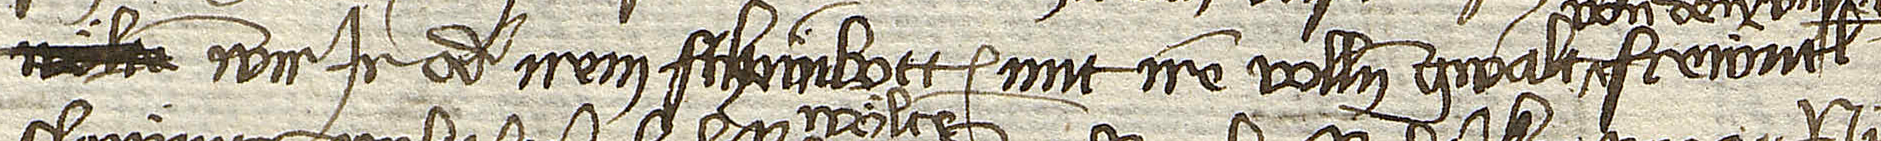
wölte* wir Ir od* irem ſcheinbott* mit ire* volln* gwalt freẅntl*
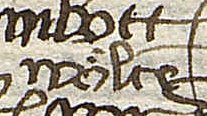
wölte*
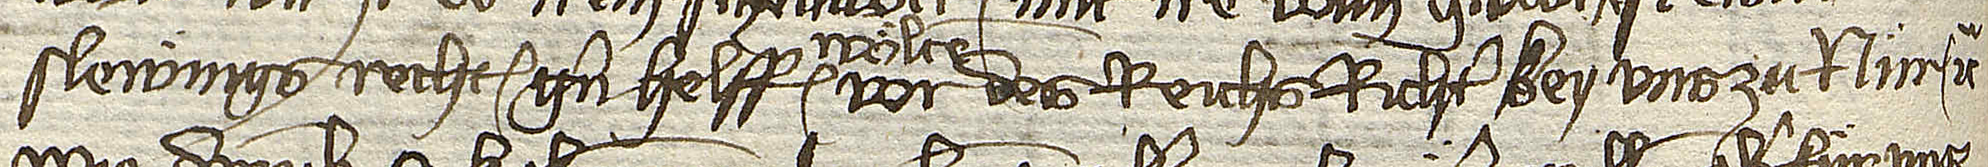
ſleẅnigs recht* g*n helff* vor des Reichs Richt* bey vns ʒu Nür* ec*
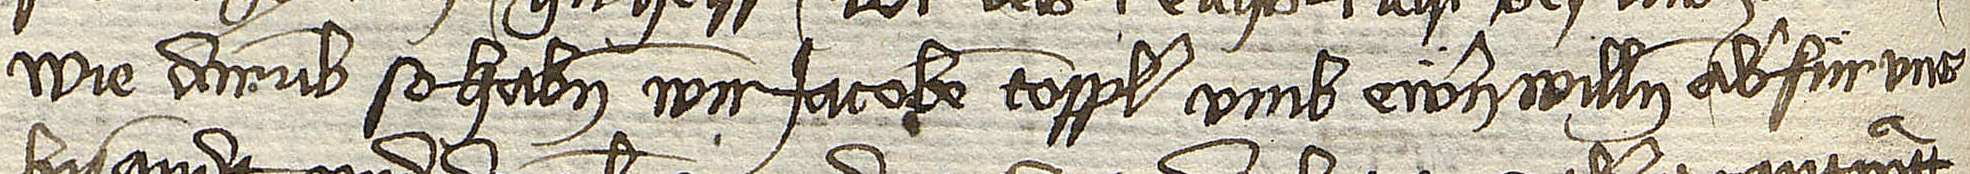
wie darub* ſo habn* wir Iacobe* toppl* vmb eẅ*n willn* ab* für vns
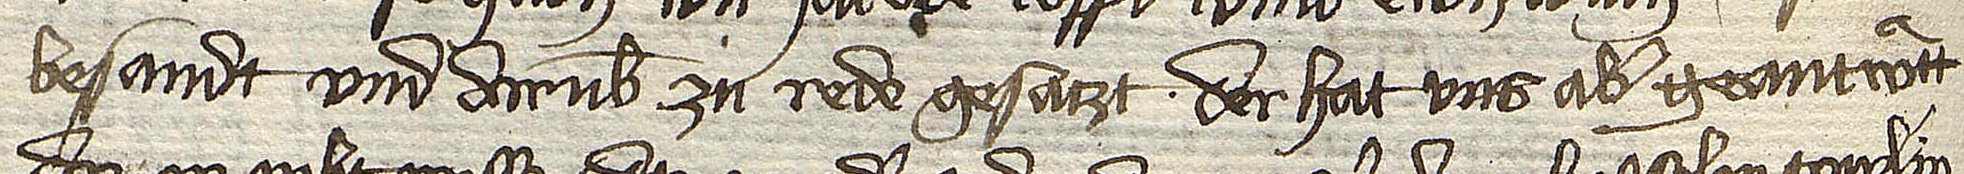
beſandt vnd darub* ʒu rede geſacʒt . Der hat vns ab* geantw*tt
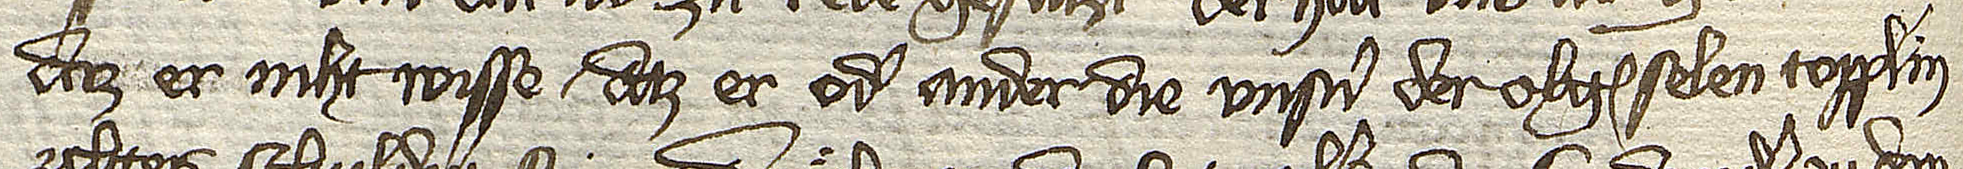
daʒ er niht wiſſe / daʒ er od* ander die vnſn* der obg* ſelen toppl*in
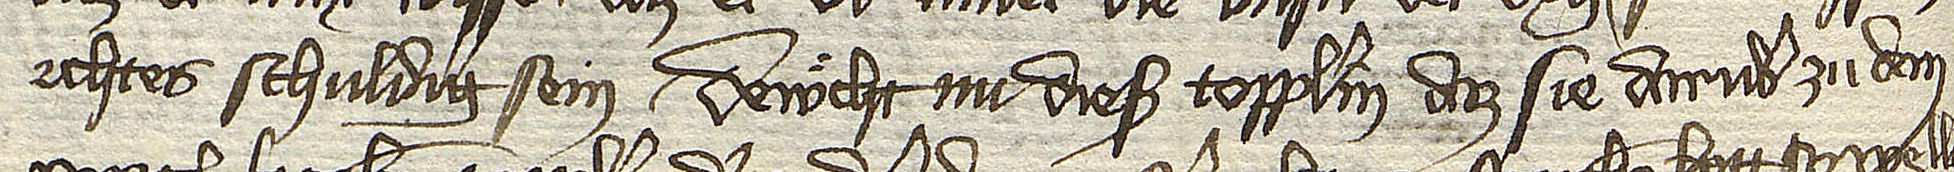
ichtes ſchuldig ſein / Deẅcht nu dieſ* toppl*in daʒ ſie darub* ʒu dem
